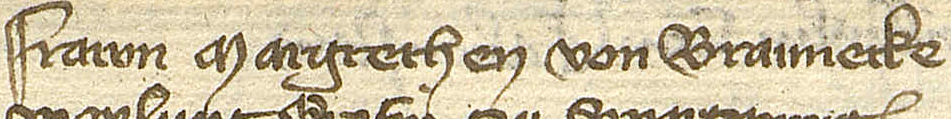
Frawn Margrethen vovn Braunecke
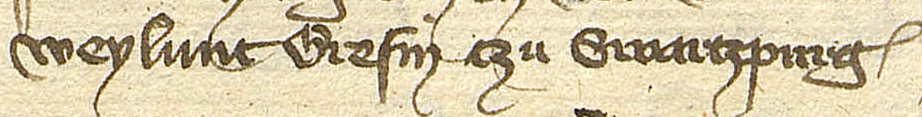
weylunt Grefin cʒu Swarcʒpurg*
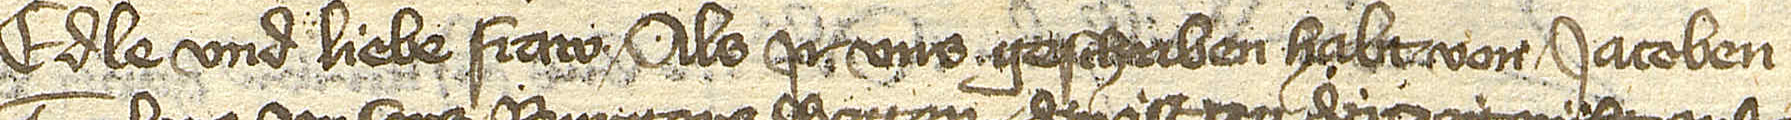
Edle vnd liebe fraw . / Als Ir vns geſchriben habt von / Iacoben
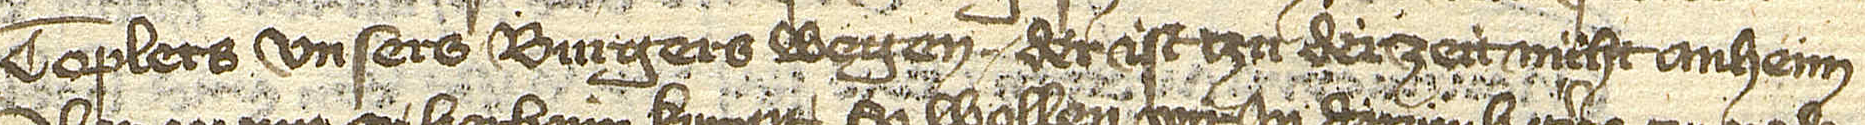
Toplers vnſers Burgers wegen . / der iſt cʒu der cʒeit nicht anheim
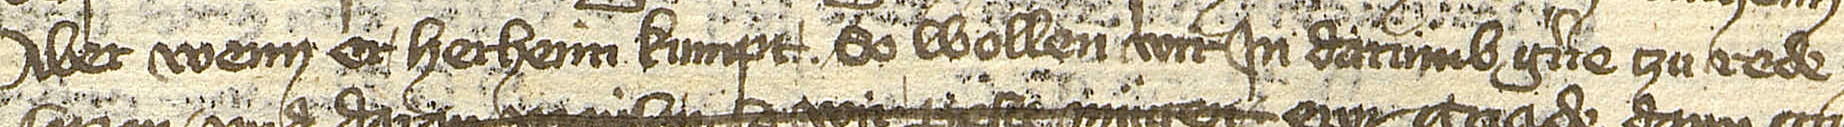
Aber wenn er herheim kumpt . So wöllen wir In darümb g*ne cʒu rede
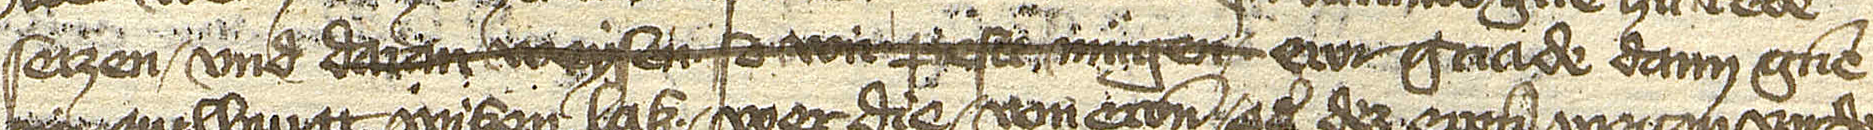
ſecʒen / vnd daran weyſen ſo wir peſtt mügen / ewr gnade dann g*ne
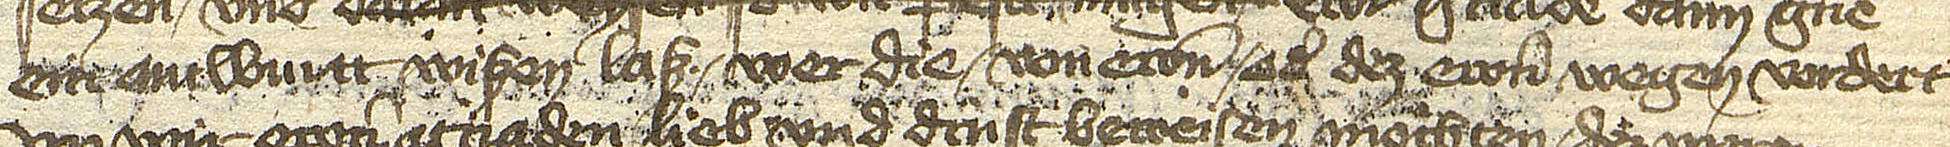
ein antwurtt wiſʒen laſʒ . / wer die / von ewn* / od* deʒ ewn* wegen vordert
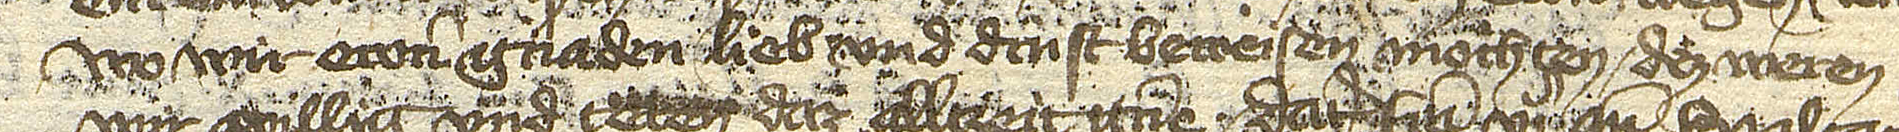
wo wir ewn* gnaden lieb vnd dinſt beweiſen möchten / deʒ weren
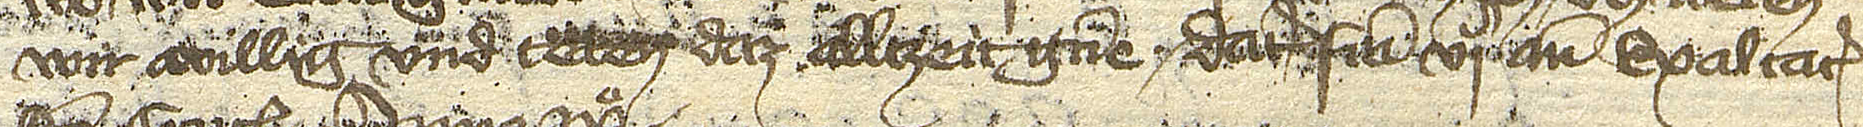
wir willig vnd teten daʒ allcʒeit g*ne . / dat* fia* vi* an* Exaltat*
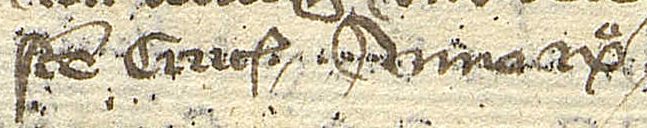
ſce* Cruc* / Anno ix* /
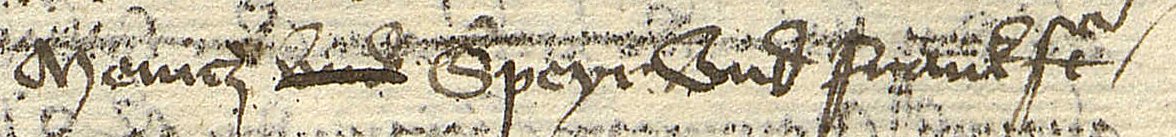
Meincʒ vnd Speyr vnd Frankf*t /
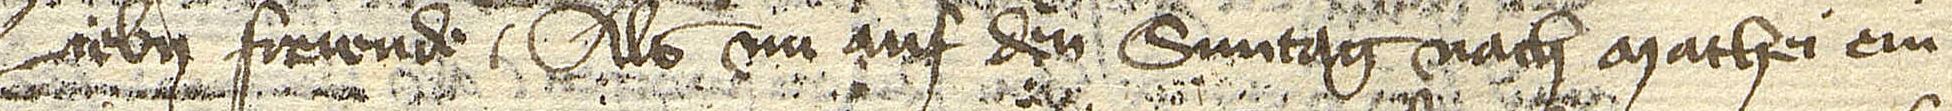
Liebn* frewnde / Als nu auf den Suntag nach Mathei ein
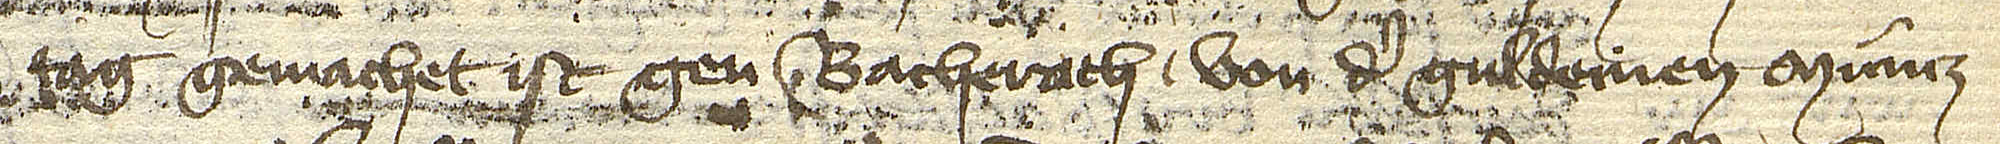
tag gemachet iſt gen Bacherach / von d* guldeinen Müncʒ
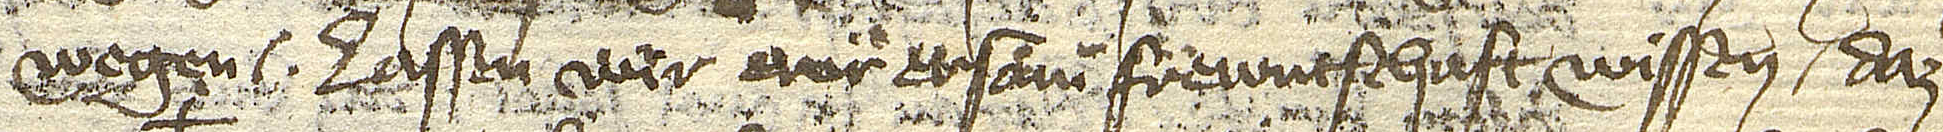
wegen / . Laſſen wir ewr erſam frewntſchaft wiſſen / daʒ
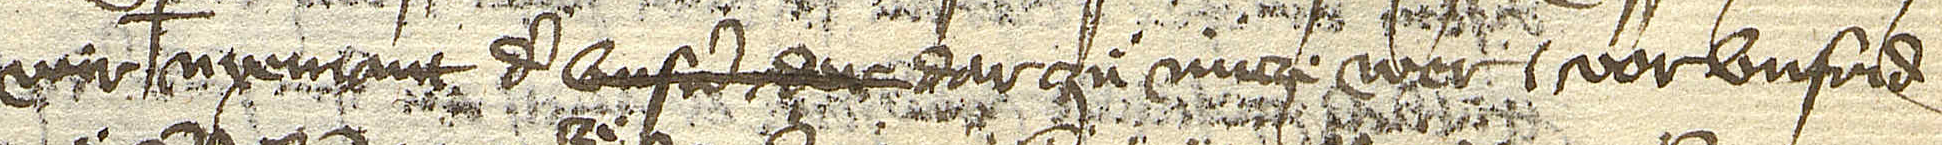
wir nyemant d* vnſn* / der darcʒü nücʒe wer / vor vnfrid
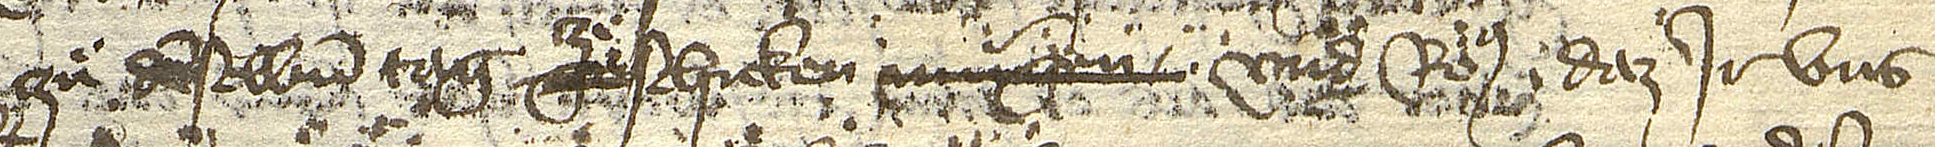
cʒü de*ſelbn* tag geſchicken mügen / . vnd Ro* . daʒ Ir vns
